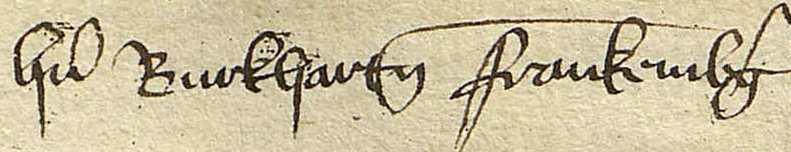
hn* Burkhartn* Frankembg*
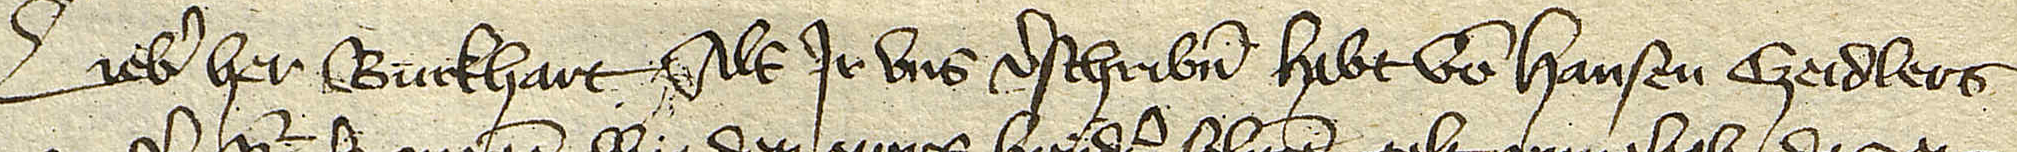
Lieb* her Burkhart / Als Ir vns v*ſchribn* habt vo* hanſen Cʒeidlers
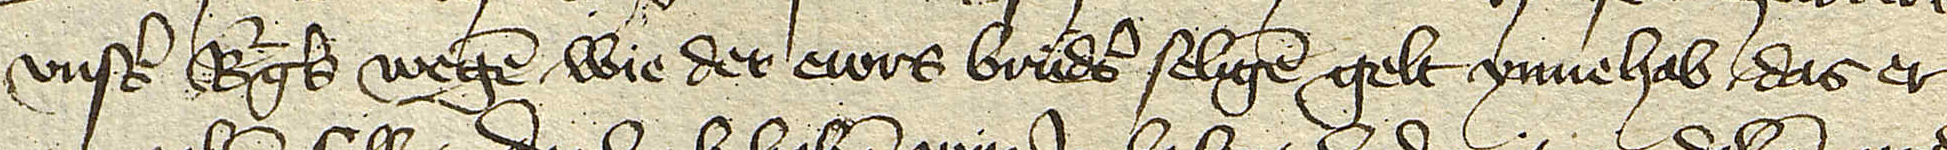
vnſs* B*g*s wege* / wie der ewrs brüds* ſelige* gelt ynnehab / das er
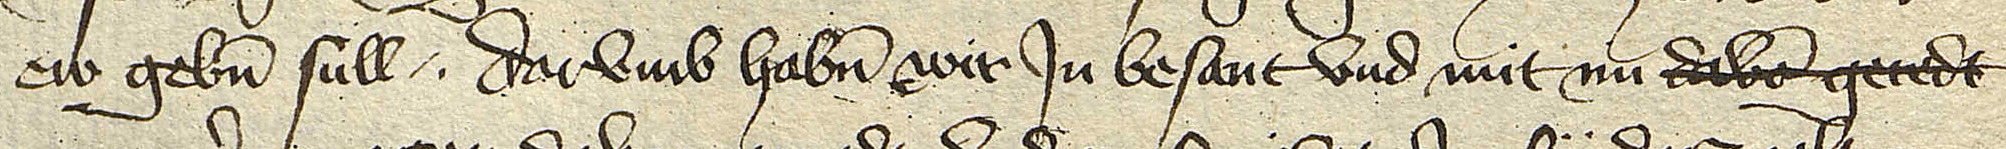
ew gebn* ſüll / . Darvmb habn* wir In beſant vnd mit im davo* geredt
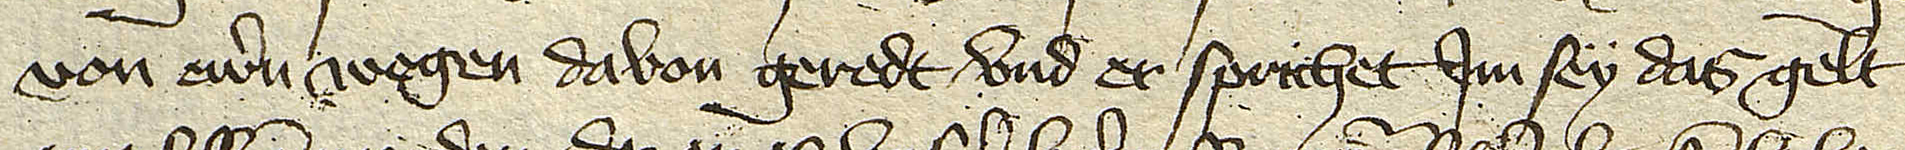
von ew*n wegen davon geredt / vnd er ſprichet Im ſey das gelt
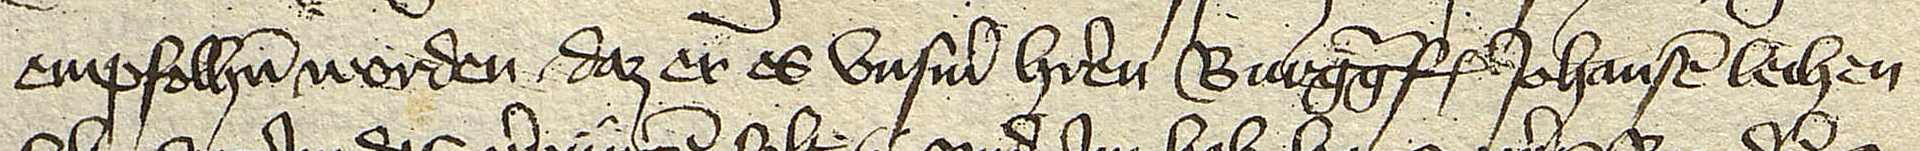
empfolhn* worden / daʒ er es vnſm* hr*en Burgg*f / Iohanſe* leihen
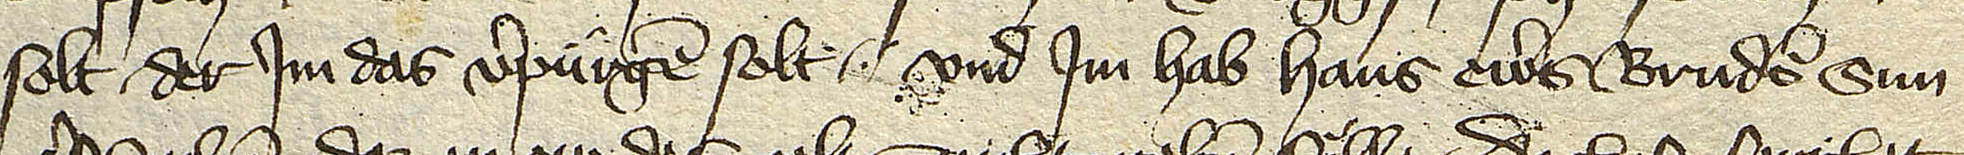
ſolt / der Im das v*pürge* ſolt / . vnd Im hab hans ew*s Bruds* Sun
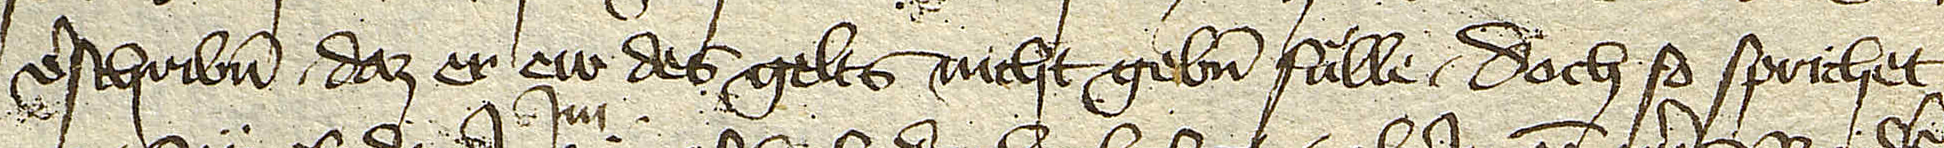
v*ſchribn* / daʒ er ew des gelts nicht gebn* ſülle / Doch ſo ſprichet
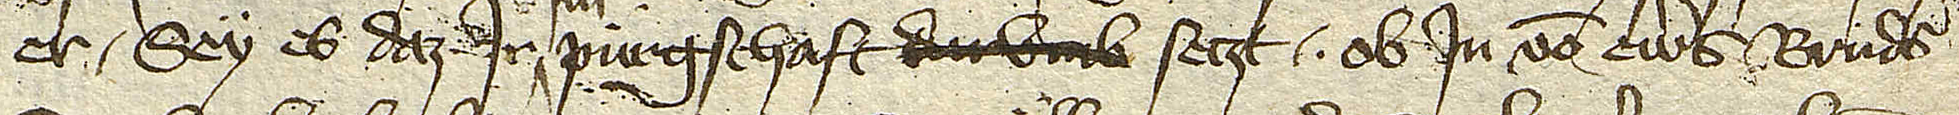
er / Sey es daʒ Ir pürgſchaft darvmb ſecʒt / . ob In vo* ew*s Bruds*
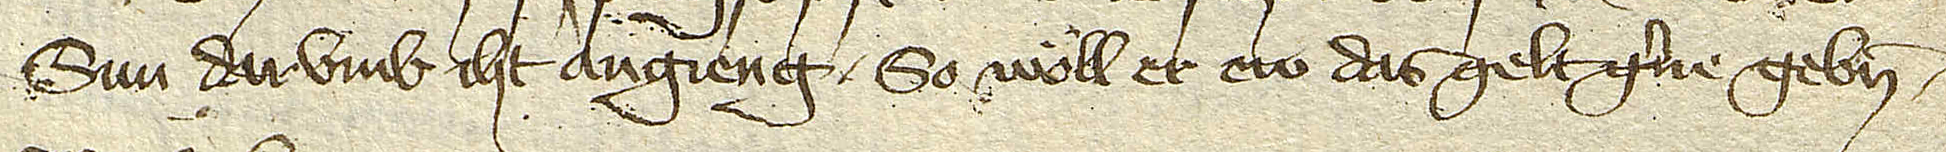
Sun darvmb iht angieng / So wöll er ew das gelt g*ne gebn* /
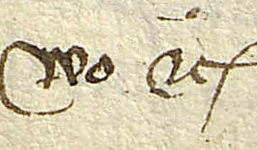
wo ec*
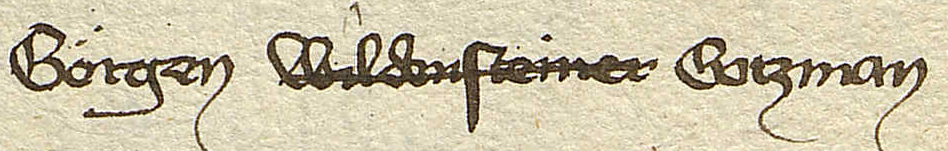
Görgen Wildenſteiner Gocʒman
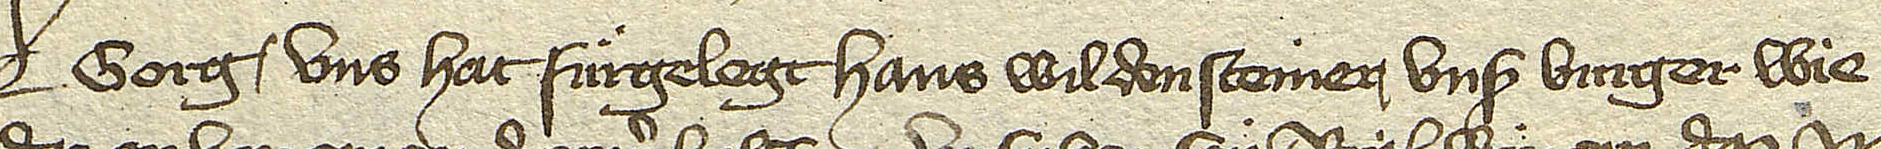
L* Gorg / vns hat fürgelegt hans wildenſteiner vnſ* burger wie
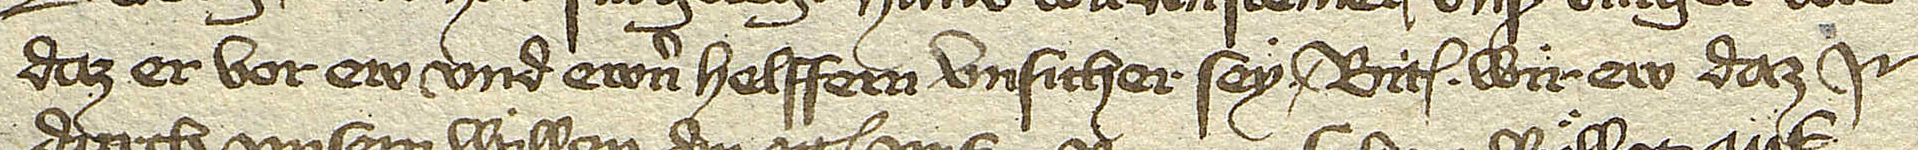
daʒ er vor ew vnd ewn* helffern vnſicher ſey . / Bit* . wir ew daʒ Ir
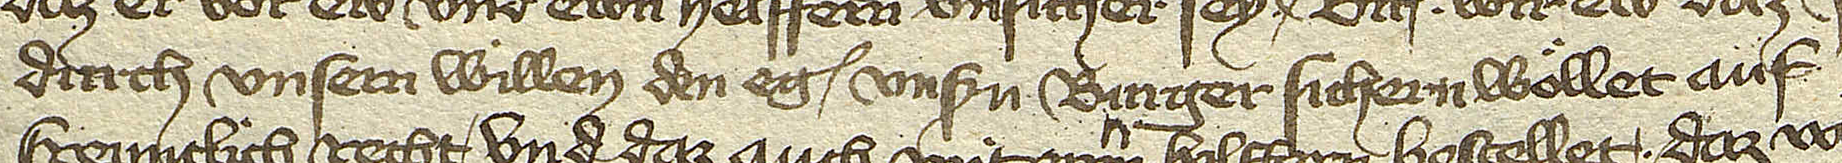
durch vnſern willen den eg* vnſ*n Burger ſichern wöllet auf
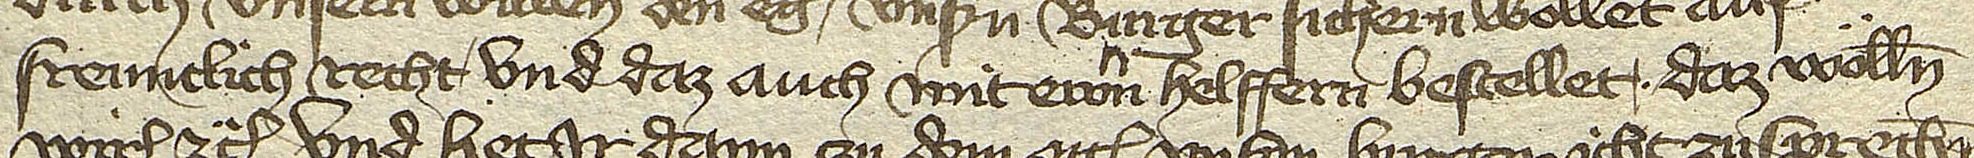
freuntlich recht / vnd daʒ auch mit ewn* helffern beſtellet / . daʒ wölln*
